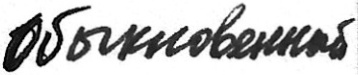обыкновенный
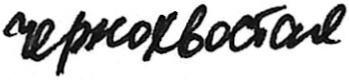чернохвостая
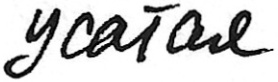усатая
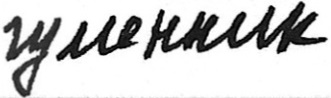гуменник
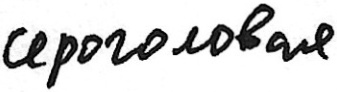сероголовая
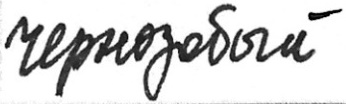чернозобый
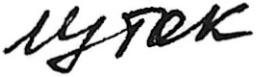луток
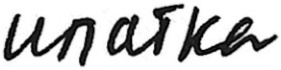ипатка
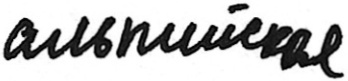альпийская
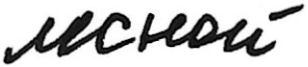лесной
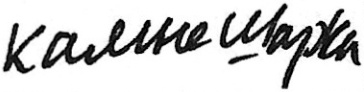камнешарка
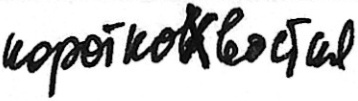короткохвостая
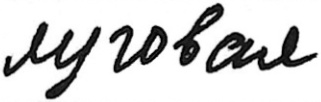луговая
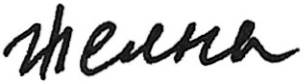желна
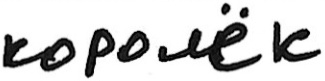королёк
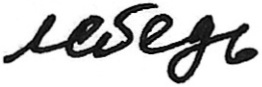лебедь
